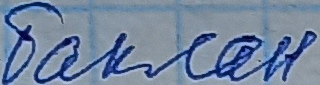баклан
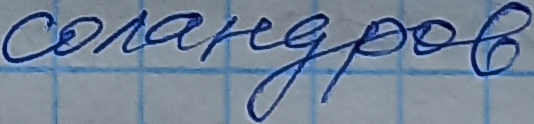соландров
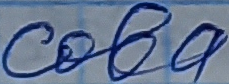сова
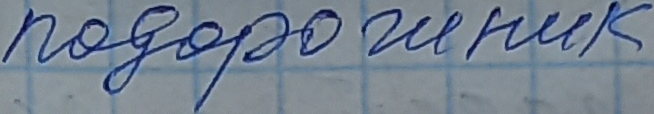подорожник
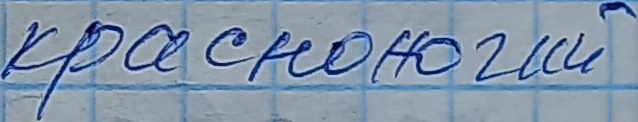красноногий
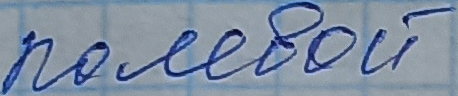полевой
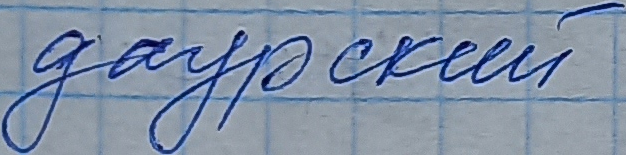даурский
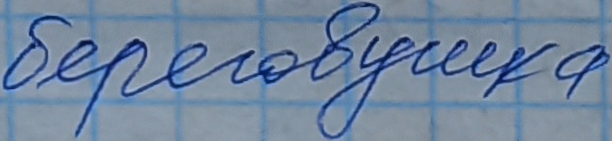береговушка
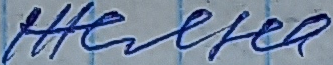желна
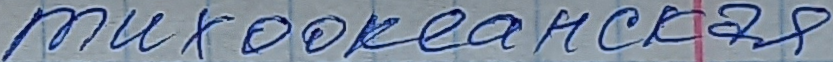тихоокеанская
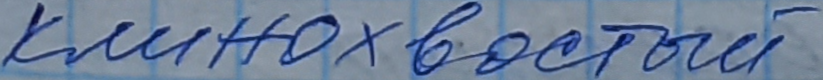клинохвостый
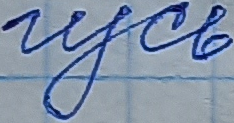гусь
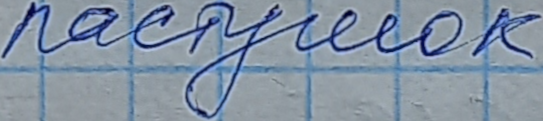пастушок
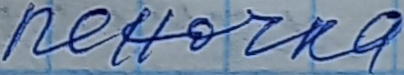пеночка
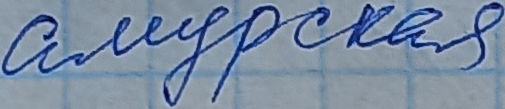амурская
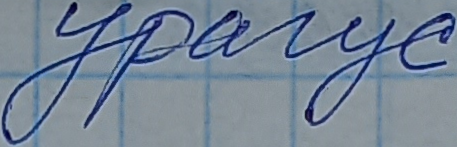урагус
